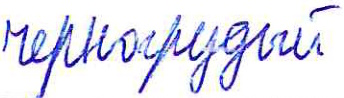черногрудый
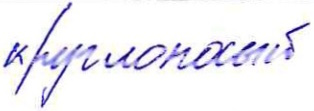круглоносый
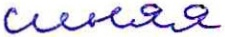синяя
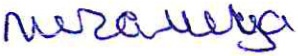пигалица
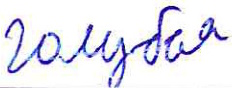голубая
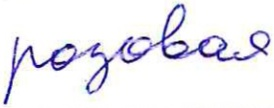розовая
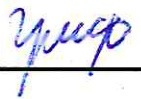гриф
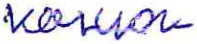канюк
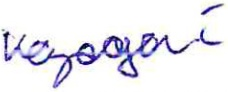козодой
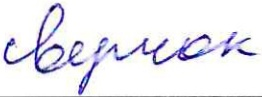сверчок
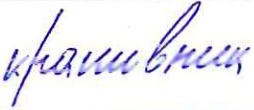крапивник
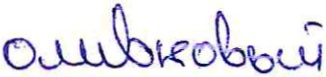оливковый
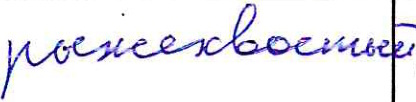рыжехвостый
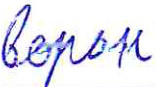ворон
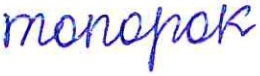топорок
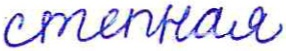степная
